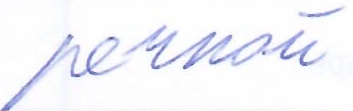речной
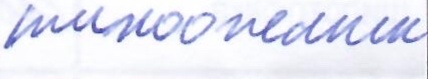тихоокеанск
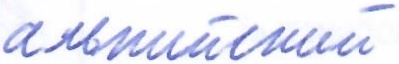альпийский
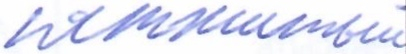пятнистый
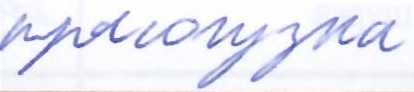прясогузка
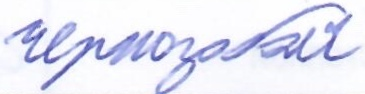чернозобая
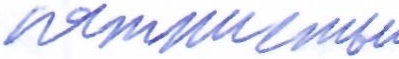пятнисты
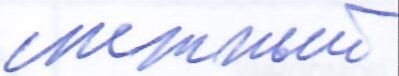снежный
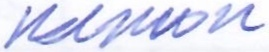канюк
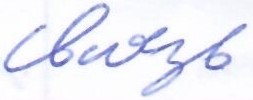свиязь
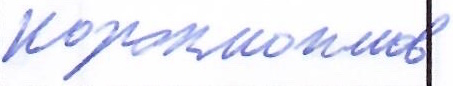коропмоплюв
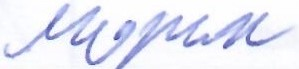люрик
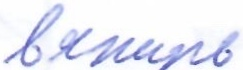вяхипь
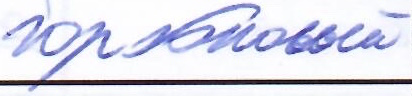горбоносый
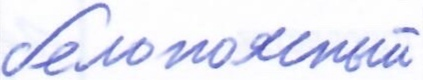белопоясный
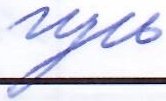гусь
